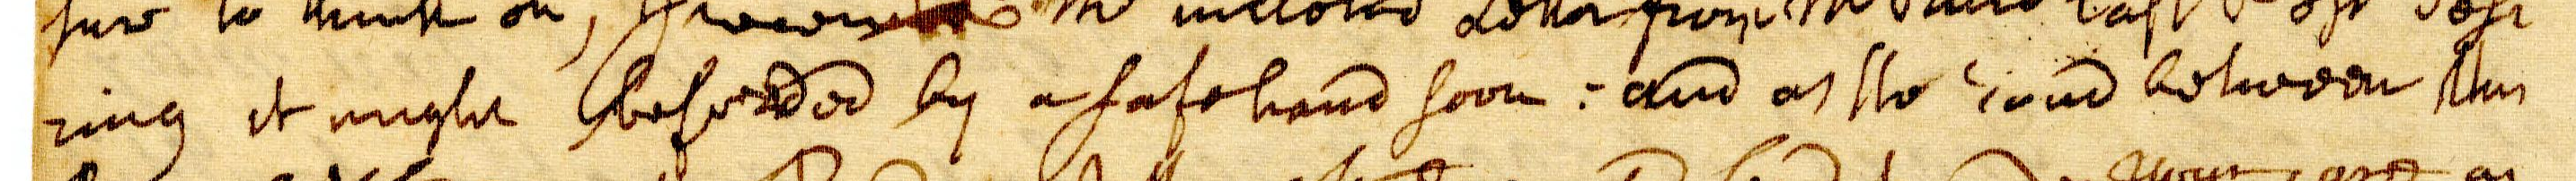ring it might be forwarded by a safe hand soon. -and as the road between this
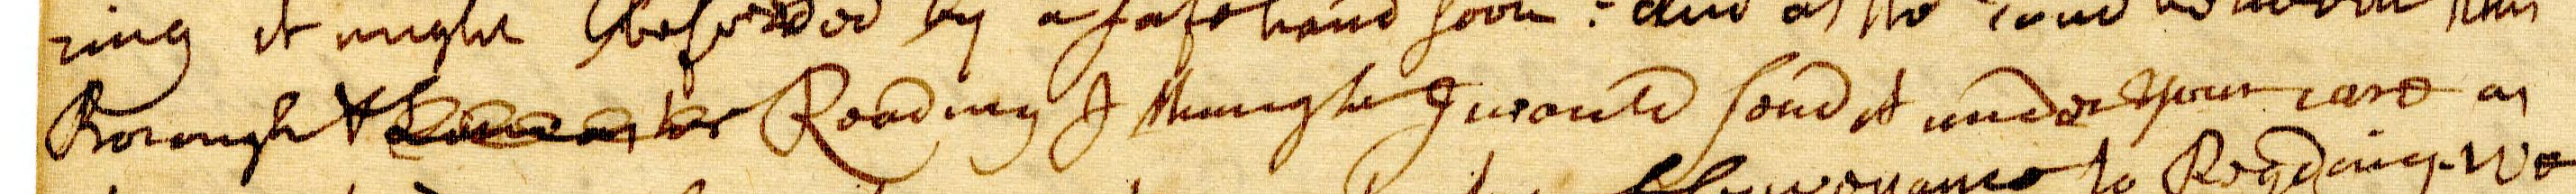Borough [________] Reading I thought I would Send it under Your care as
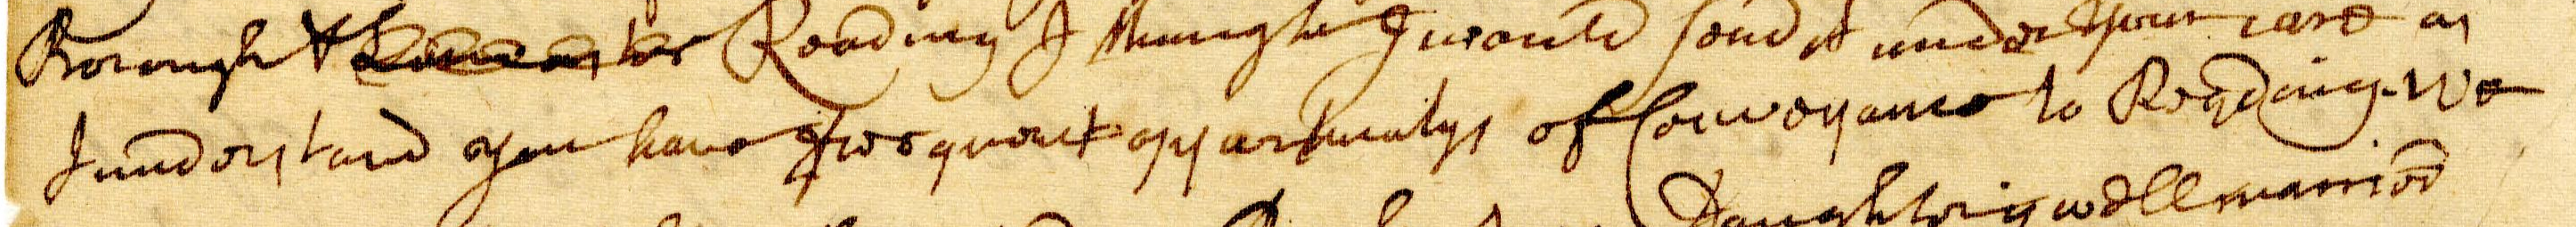I understand you have two great opportunitys of Conveyance to Rending. We
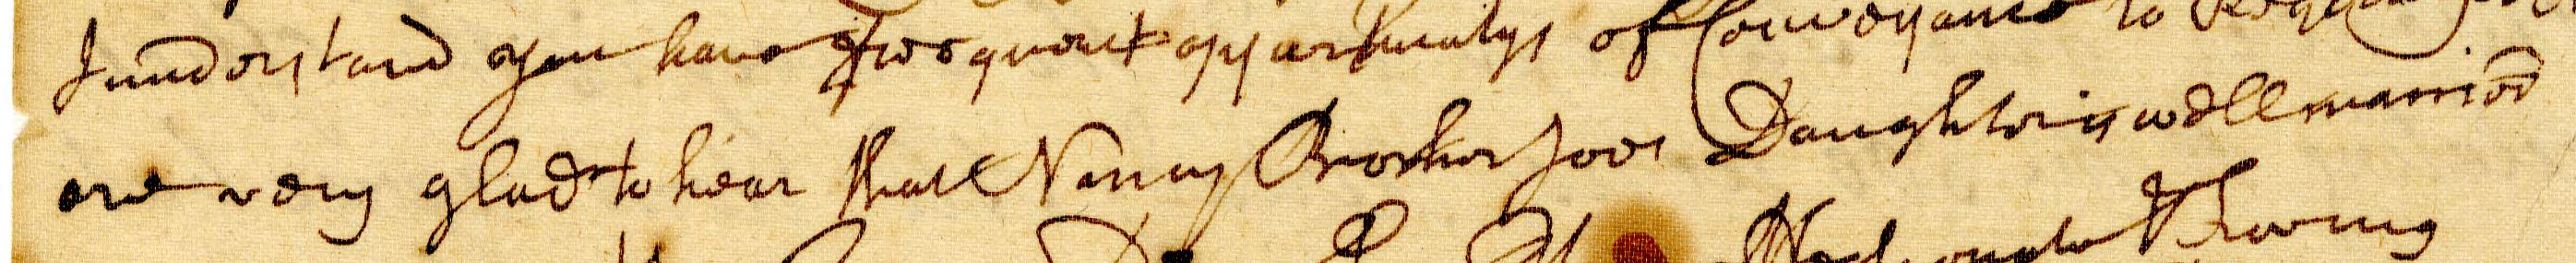an very glad to hear that Nancy Brother Joes Daughter is well married
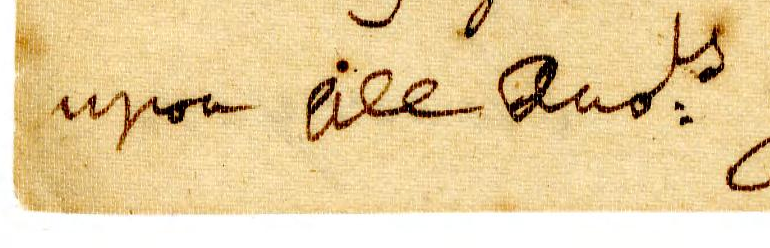upon all Acc:^ts
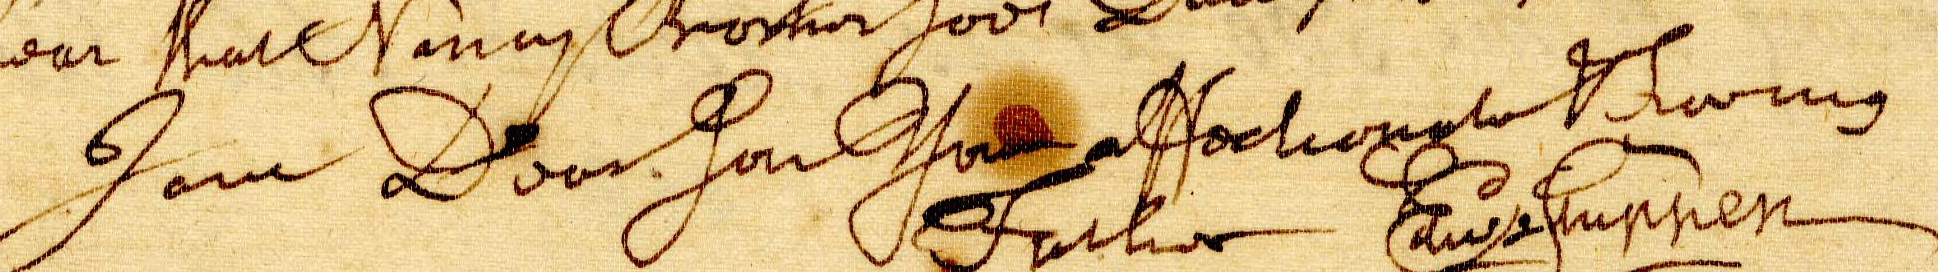I am Dear Son Your affectionate & Loving
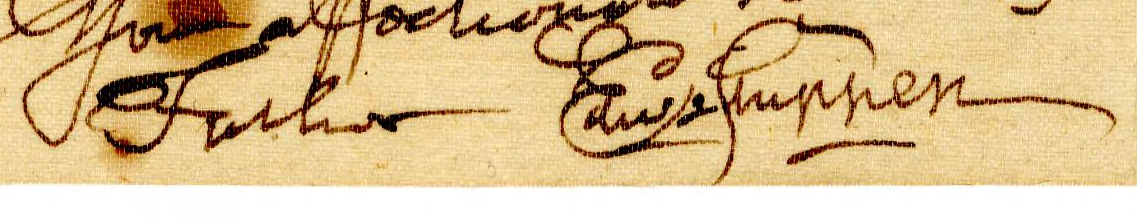Father Edwd Shippen
